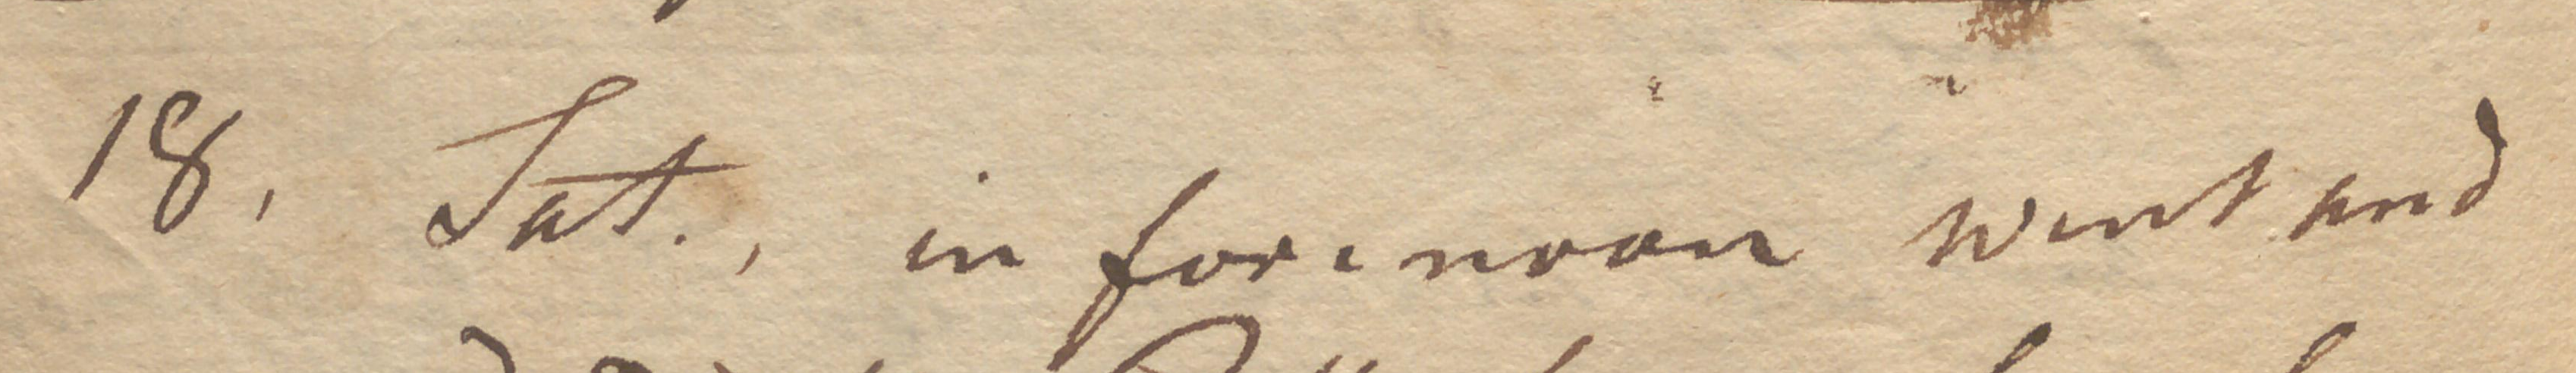18. Sat., in forenoon went and
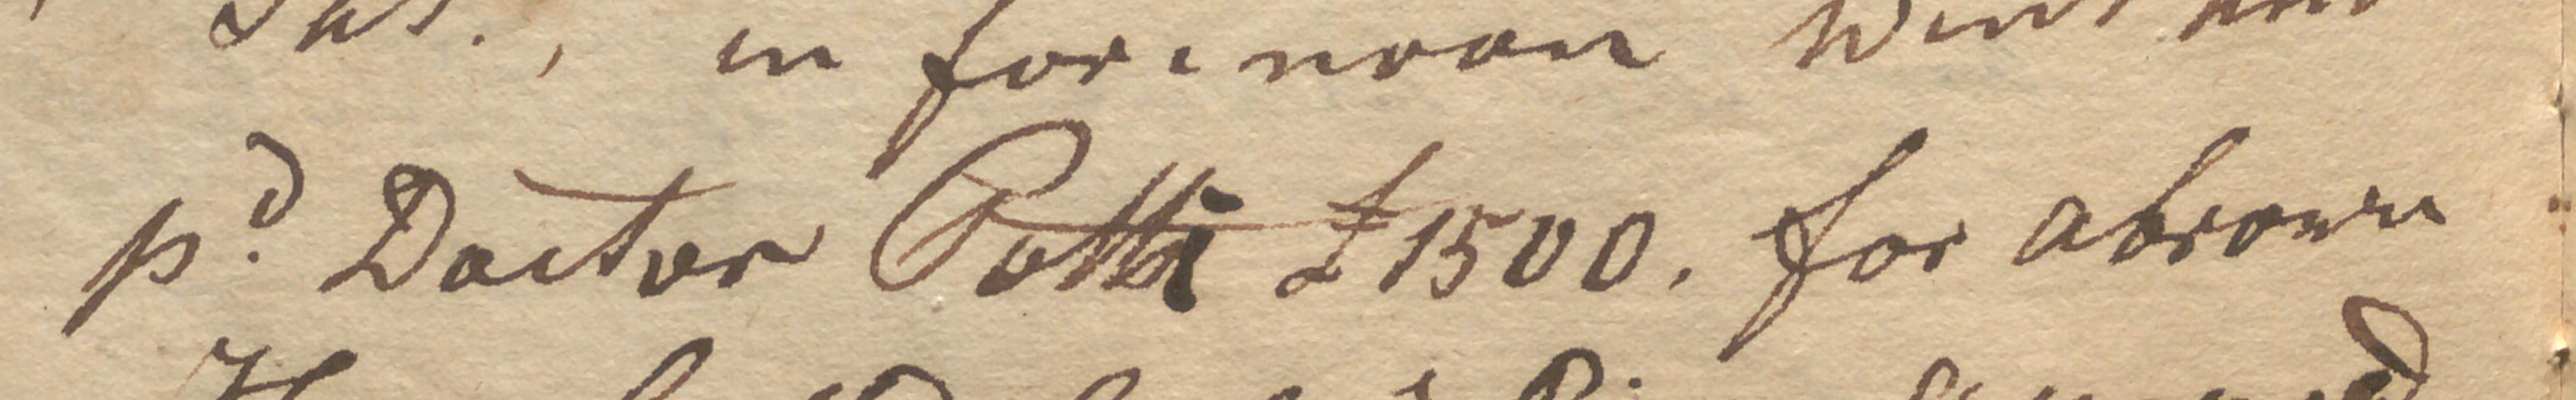p^d. Dacter Potts £1500. for a brown
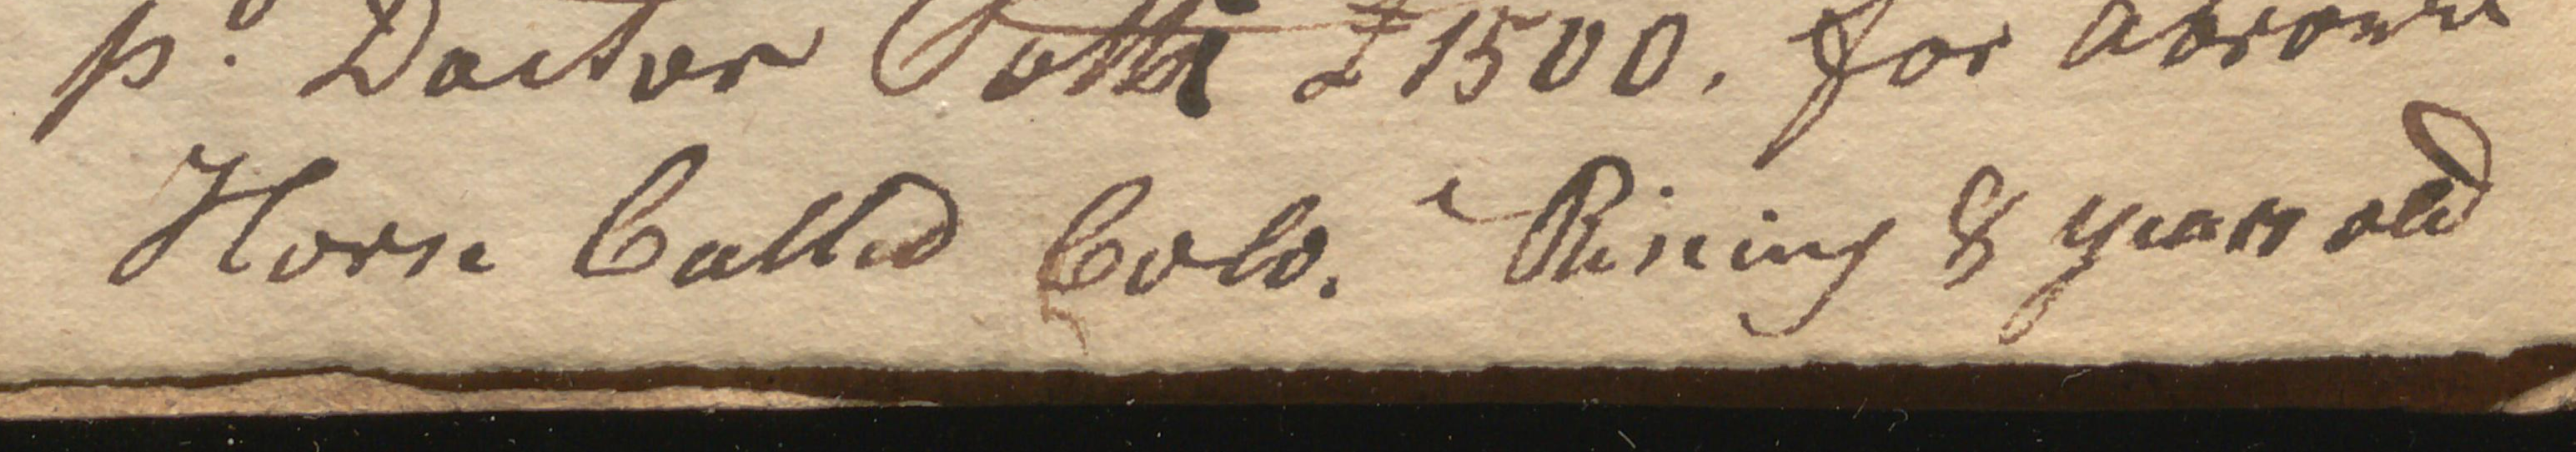Horse Called Colo^l. Rining 8 year old
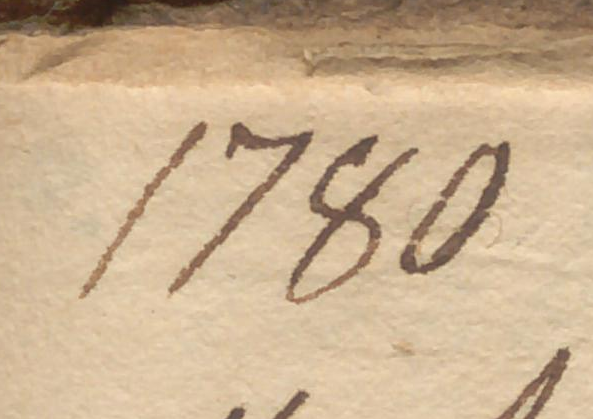1780
